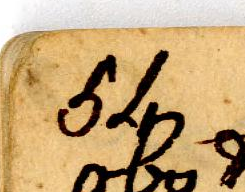54
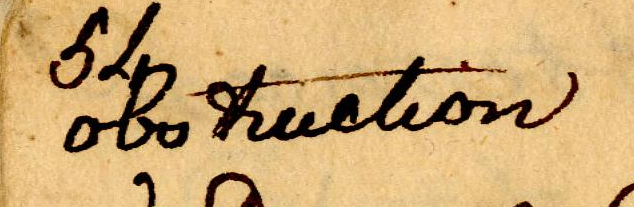obstruction
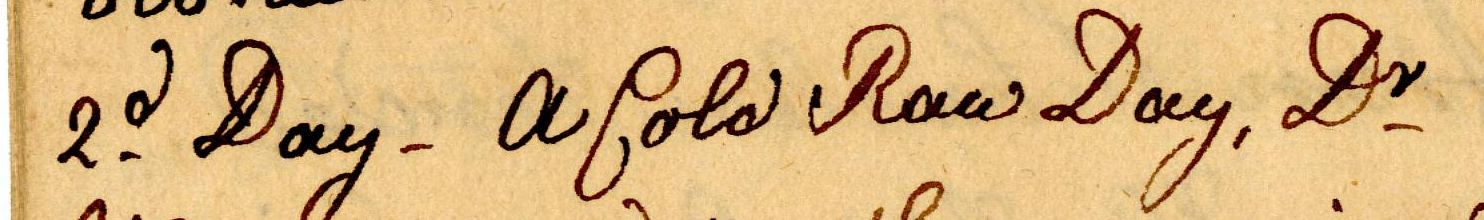2^d. Day- A Cold Raw Day, D^r.
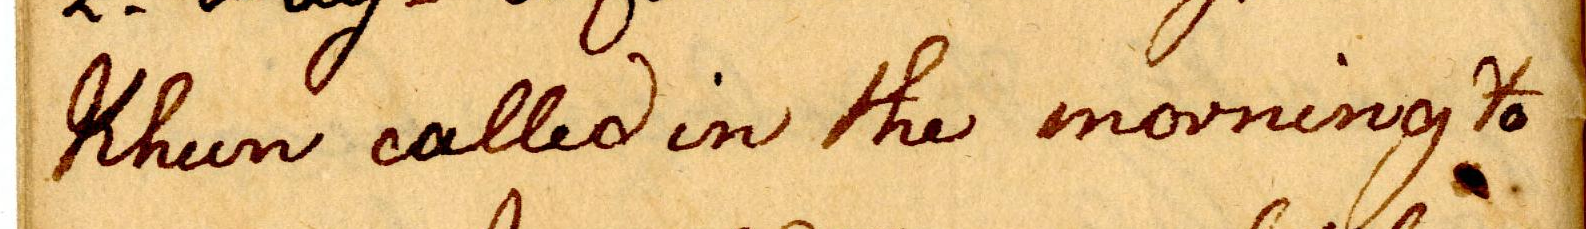Khun called in the morning to
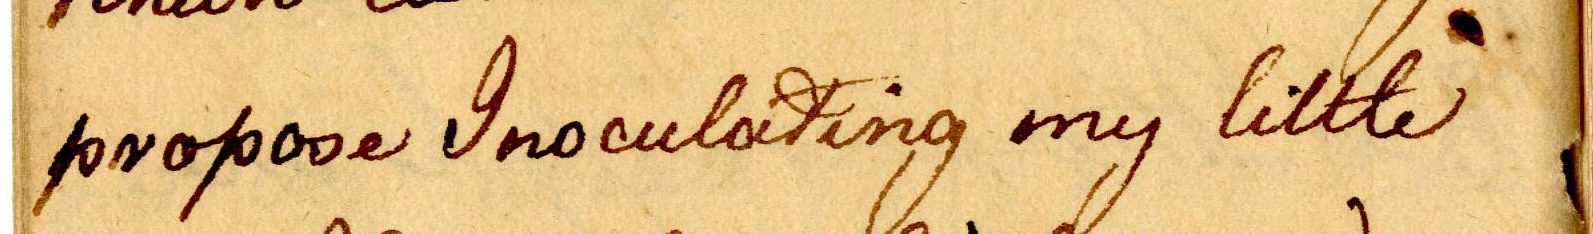propose Inoculating my little
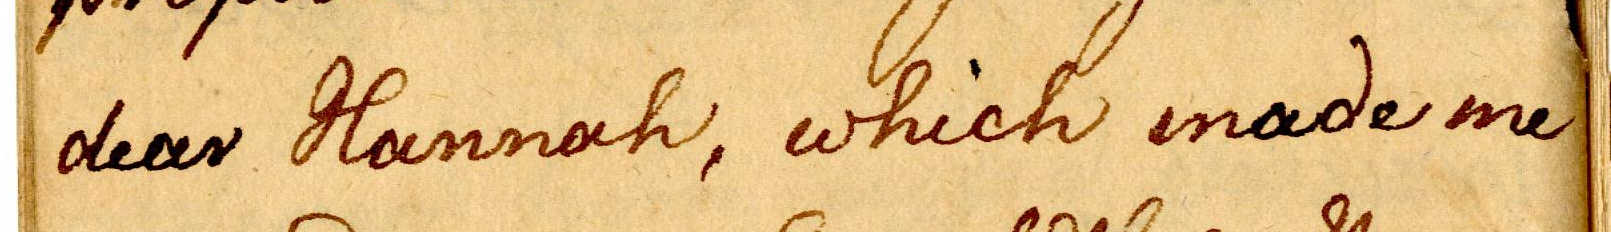dear Hannah, which made me
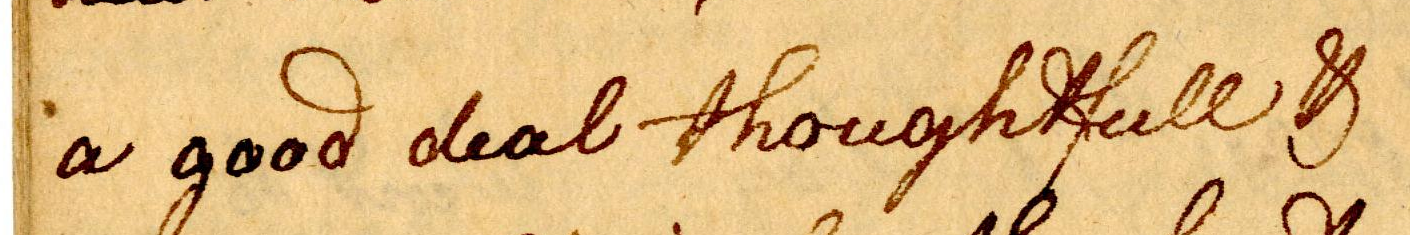a good deal thoughtfull &
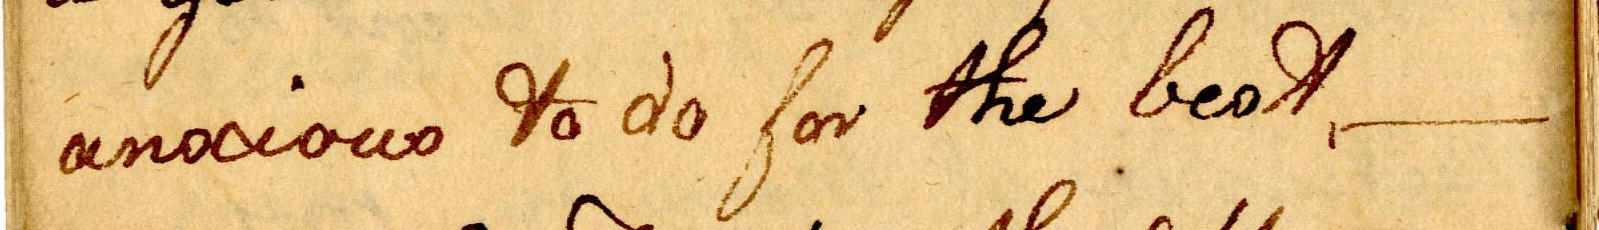anxious to do for the best-
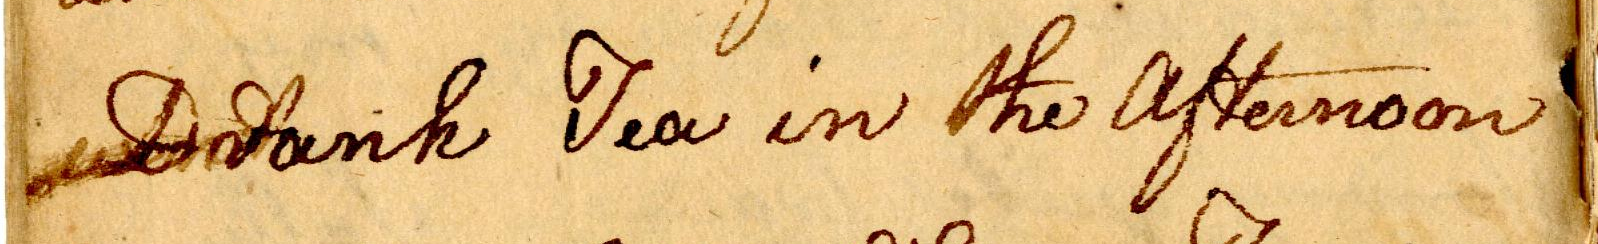Drank Tea in the Afternoon
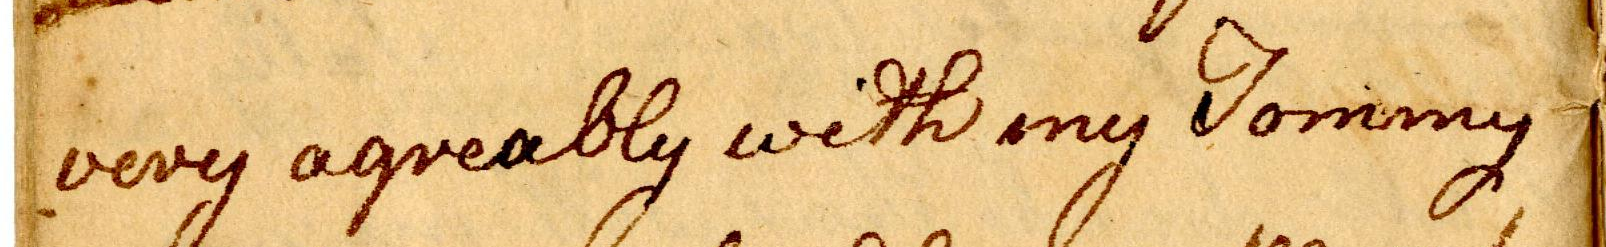very agreably with my Tommy
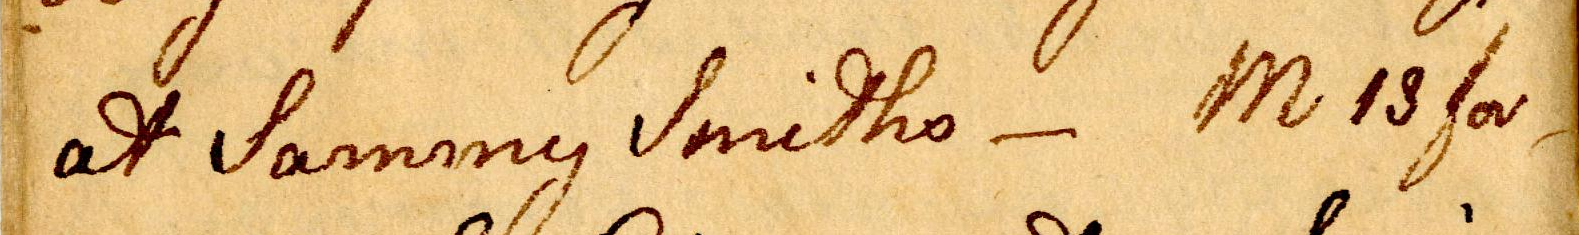at Sammy Smiths- M 13 for
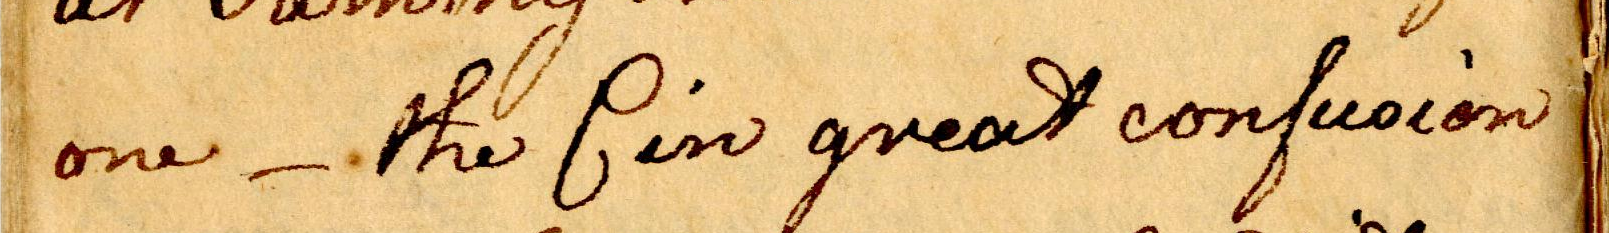one- the Cin great confusion
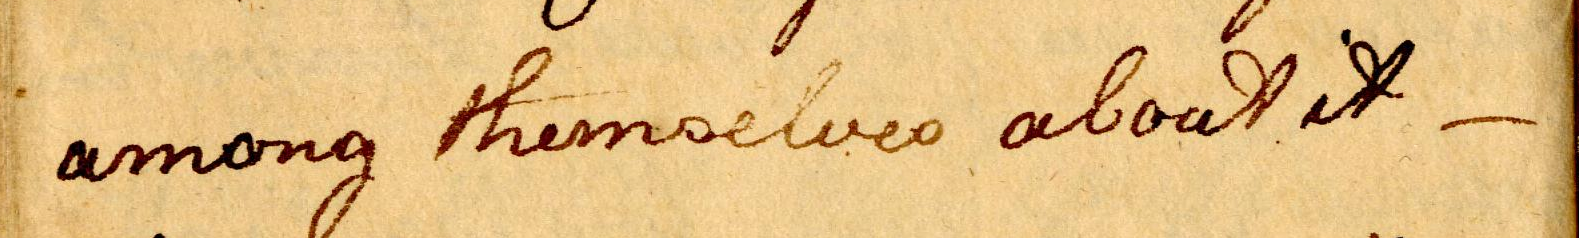among themselves about it-
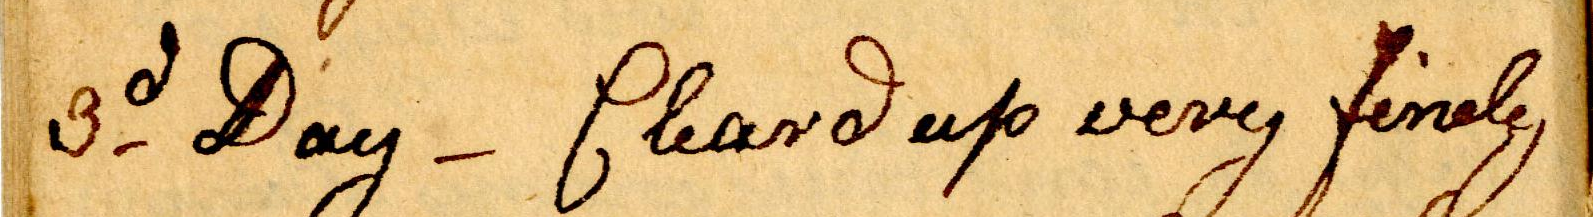3^d. Day- Cleard up very finely
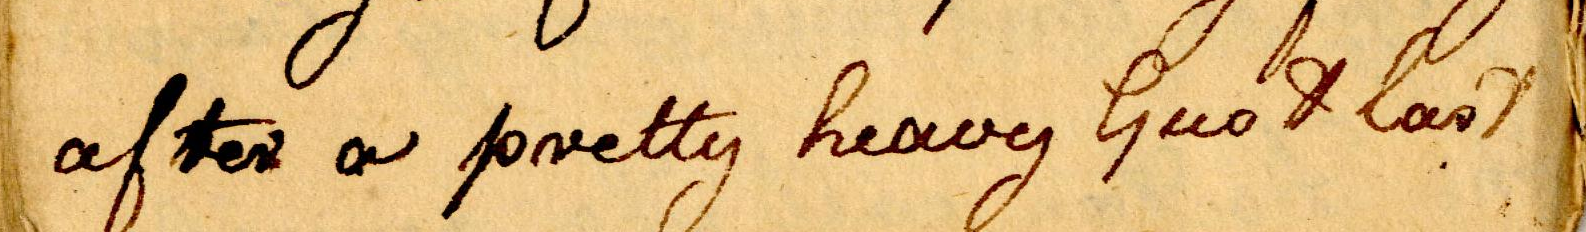after a pretty heavy Gust last
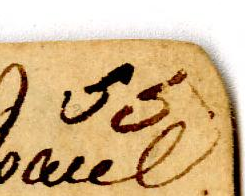55
